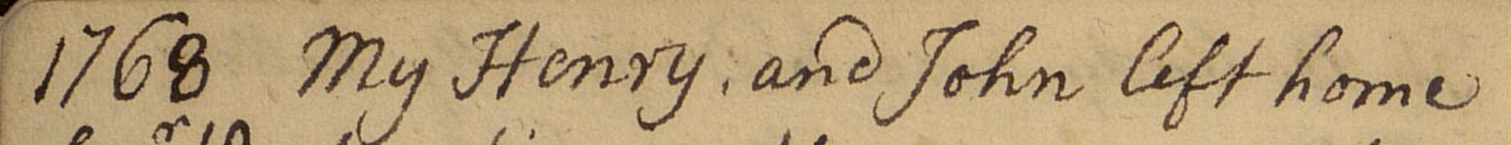1768 My Henry, and John left home
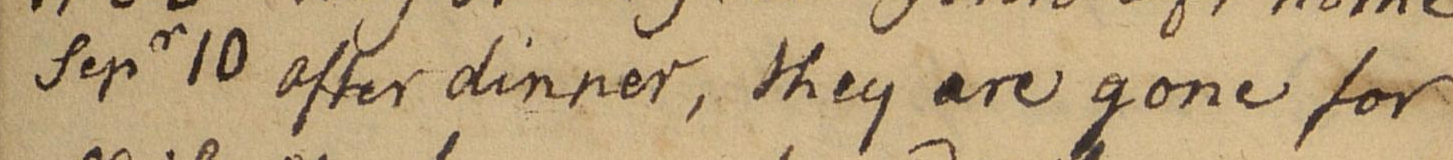Sep^r 10 after dinner, they are gone for
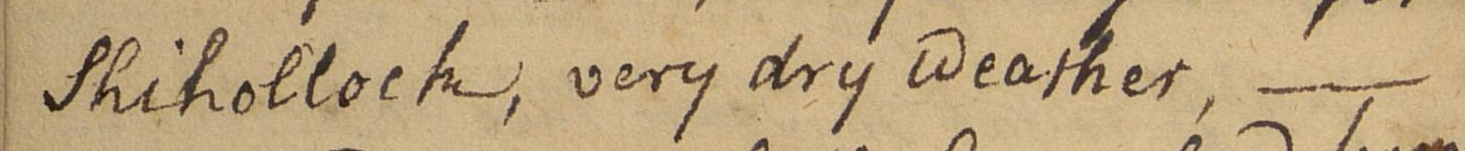Shihollock, very dry weather-
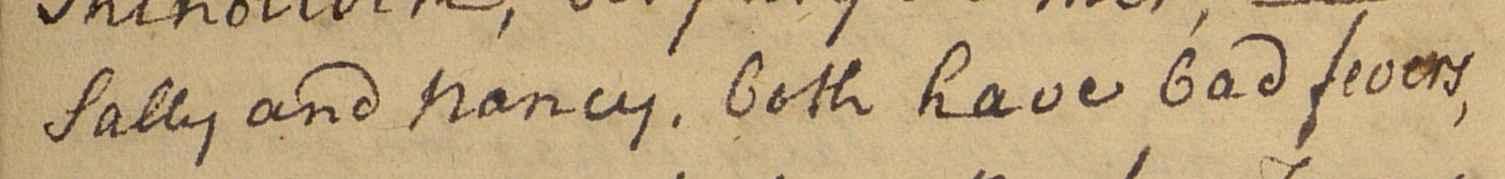Sally and Nancy, both have bad fevers,
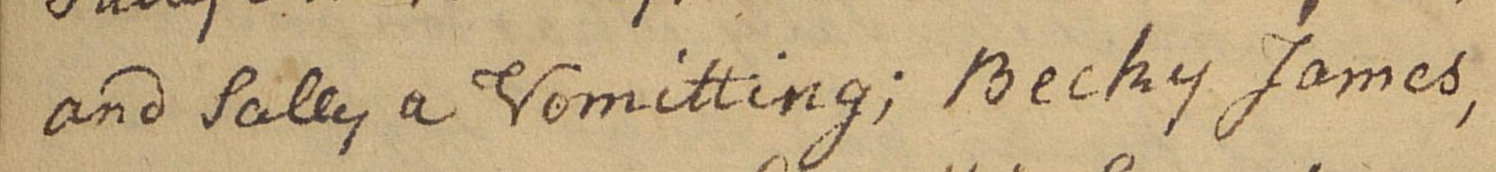and Sally a Vomitting; Becky James,
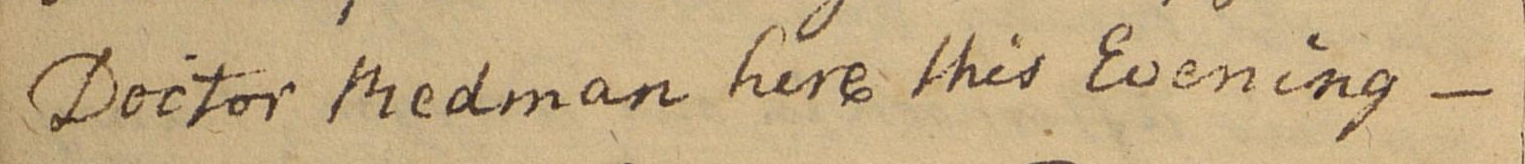Doctor Redman here this Evening-
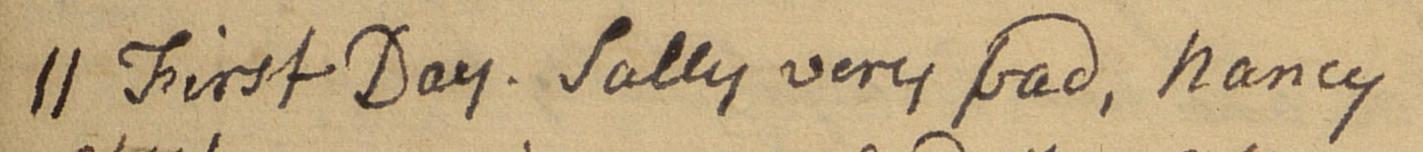11 First Day. Sally very bad, Nancy
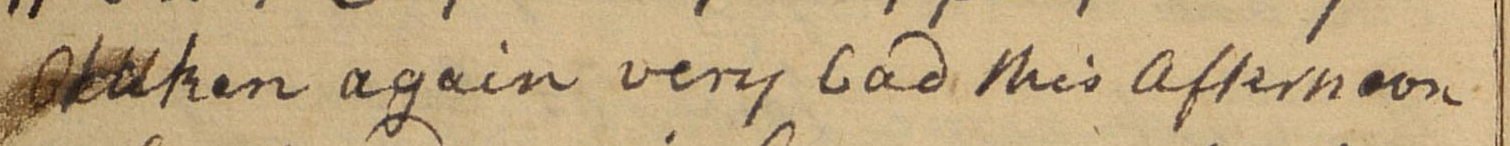taken again very bad this Afternoon
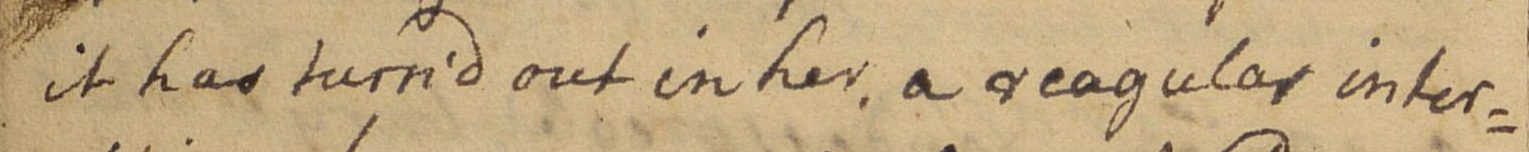it has turn'd out in her a reagular inter-
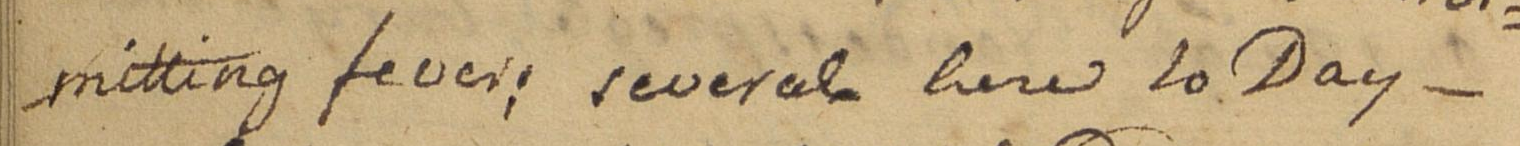mitting fever; several here to Day-
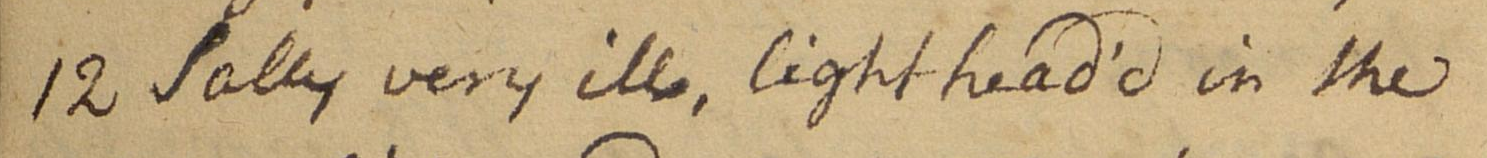12 sally very ill, lighthead'd in the
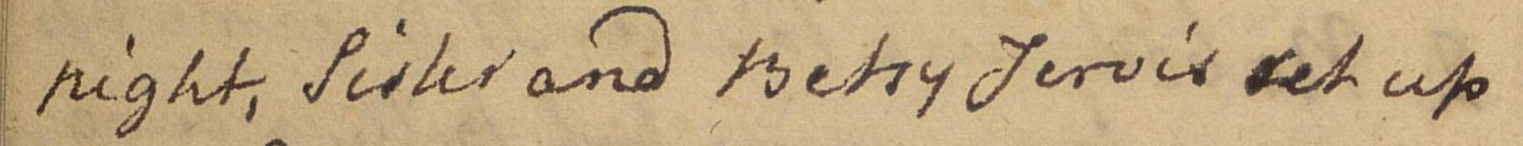night, Sister and Betsy Jervis set up
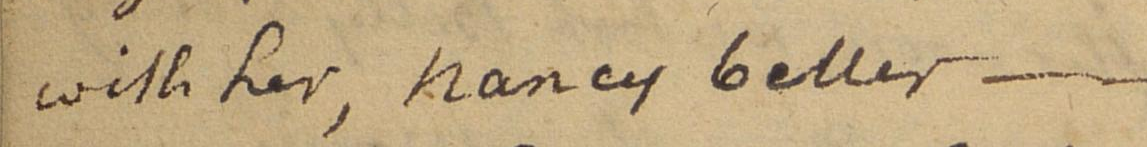with her, Nancy better-
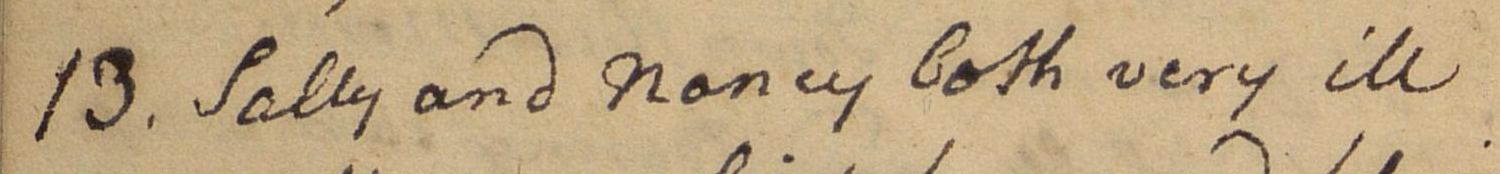13. Sally and Nancy both very ill
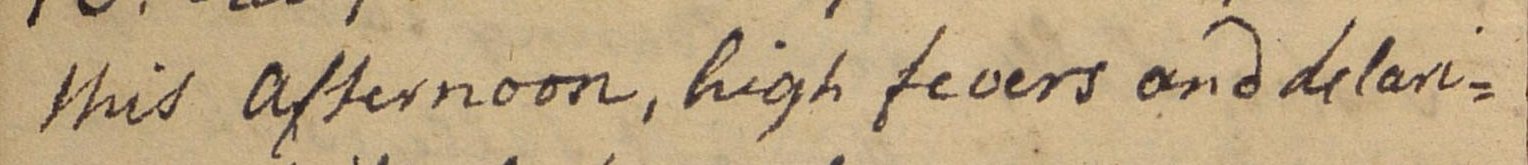this Afternoon, high fevers and delari-
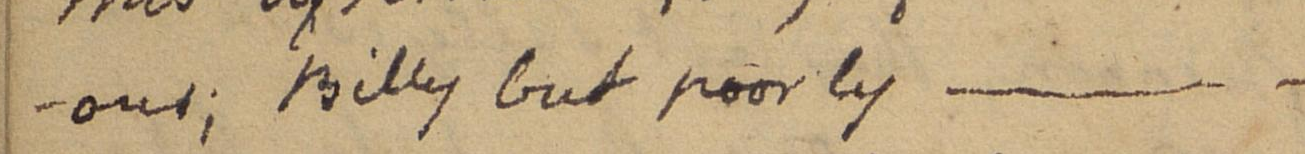-ous; Billy but poorly-
